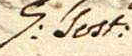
5:a Test:a
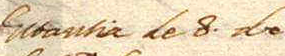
Estansia de 8. de
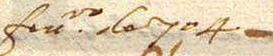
feu.ro de 704
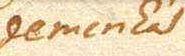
de menhã
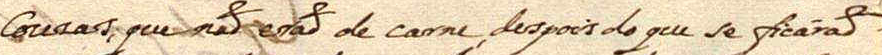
couzas, que naõ eraõ de carne, despois do que se ficáraõ
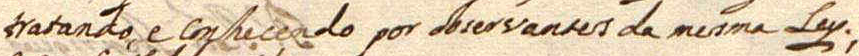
tratando, e conhecendo por observantes da mesma Ley.
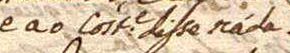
e ao Cost.e disse náda.
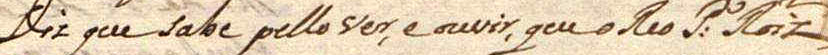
Diz que sabe pello ver, e ouvir, que o Reo P:o Roīz
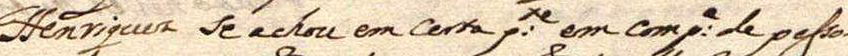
Henriquez se achou em certa p:te em comp:a de pesso
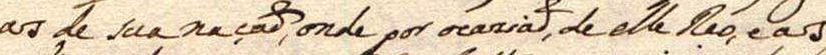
as de sua naçaõ, onde por ocaziaõ, de elle Reo, e as
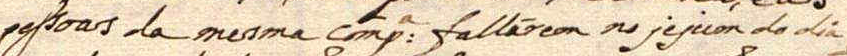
pessoas da mesma comp:a fallárem no jejum do dia
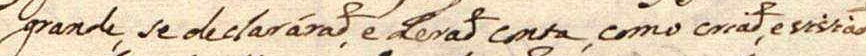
grande, se declaráraõ, e deraõ conta, como criaõ, e viviaõ
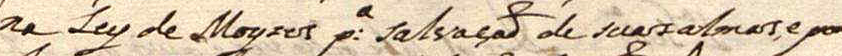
na Ley de Moyzes p:a salvaçaõ de suas almas, e por
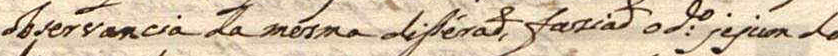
observancia da mesma disséraõ, faziaõ o d:o jejum do
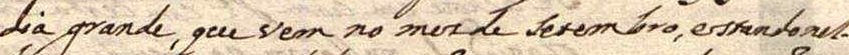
dia grande, que vem no mez de setembro, estando nel
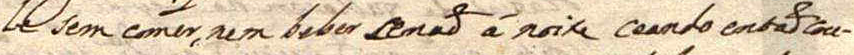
le sem comer, nem beber senaõ á noite ceando entaõ cou
